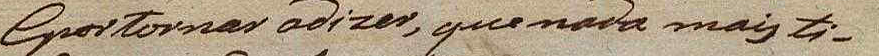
E por tornar a dizer, que nada mais ti
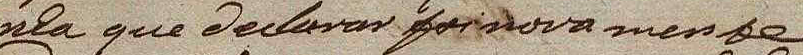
nha que declarar foi novamente
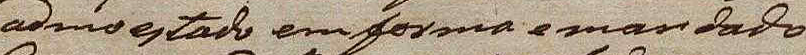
admoestado em forma e mandado
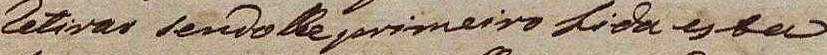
Retirar sendolhe primeiro Lida esta
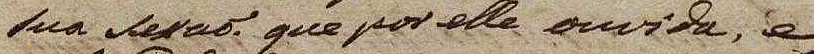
sua sessaõ que por elle ouvida, e
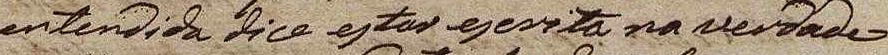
entendida dice estar escrita na verdade
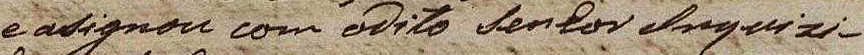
e asignou com o dito senhor Inquizi
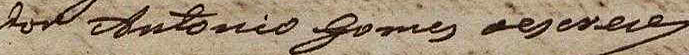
dor Antonio Gomes a escrevj
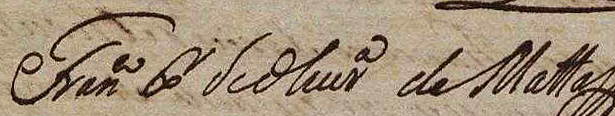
Fran.co X.r de Oliv.a da Matta
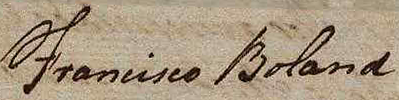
Francisco Boland
